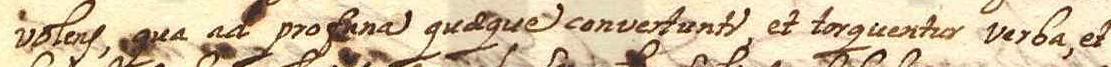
volens, qua ad profana quæque convertuntē, et torquentur verba, et
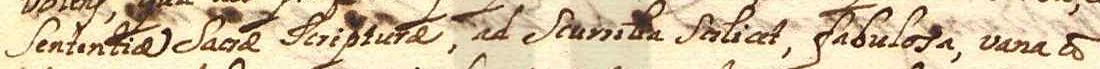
sententiæ Sacræ Scripturæ, ad Scurrilia Scilicet, fabulosa, vana cō
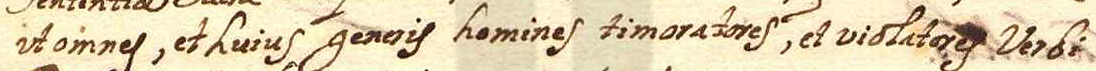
vt omnes, et huius generis homines timoratores, et violatores verbi
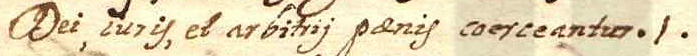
Dei, iuris, e arbitrij pænis coerceantur. /.
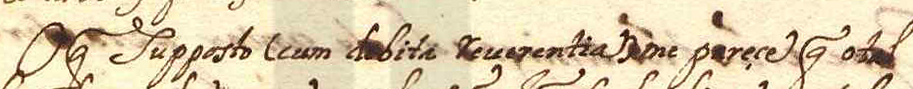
O q̄ Supposto (cum debita reuerentia) me parece q̄ o tal
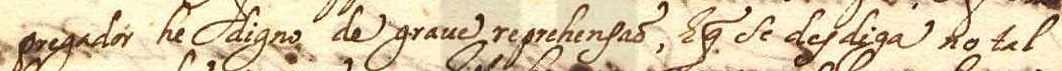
pregador he digno de graue reprehensaõ, E q̄ se desdiga no tal
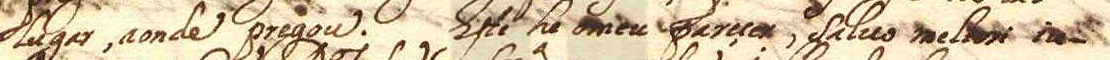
lugar, aonde pregou. Este he o meu parecer, saluo melhor iu
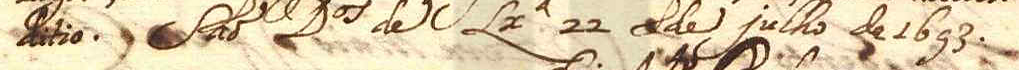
ditio. Saõ Dos de Lxa 22 de julho de 1693.
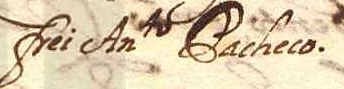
frei Anto Pacheco.
